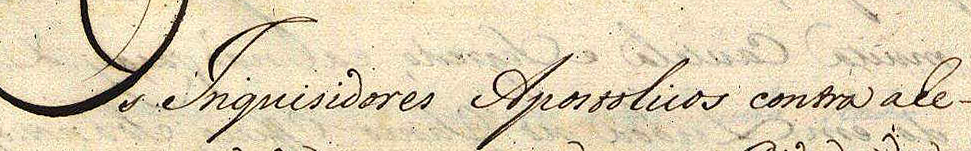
Os Inquisidores Apostolicos contra a he
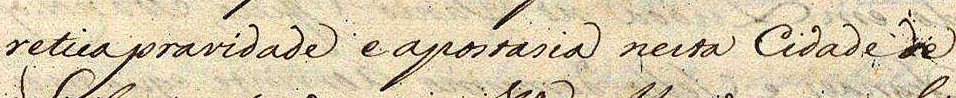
retica pravidade e apostasia nesta Cidade de
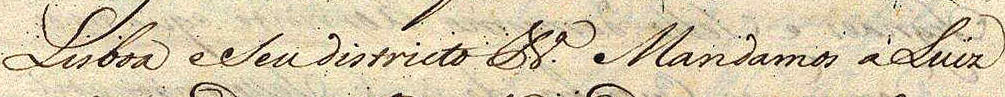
Lisboa, e seu districto &r.a Mandamos á Luiz
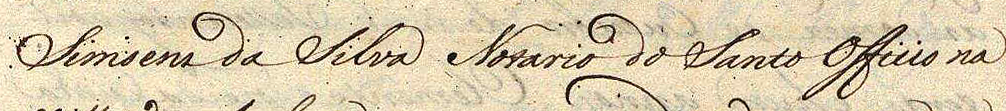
Simoens da Silva Notario do Santo Officio na
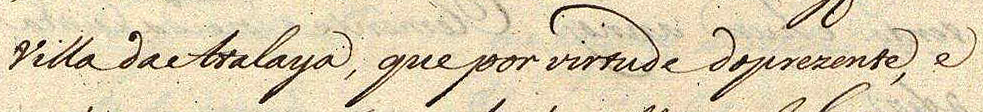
villa da Atalaya, que por virtude do prezente, e
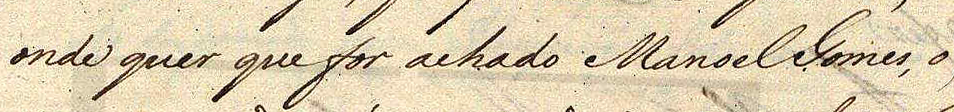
onde quer que for achado Manoel Gomes, o
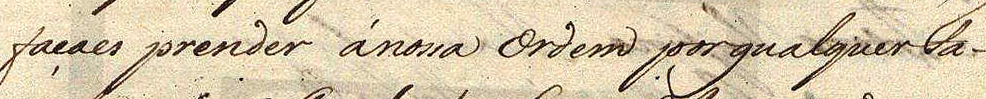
façaes prender a nossa Ordem por qualquer Fa
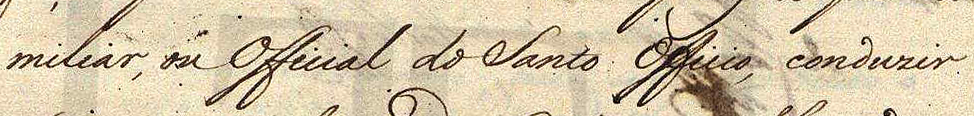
miliar, ou Official do Santo Officio, conduzir
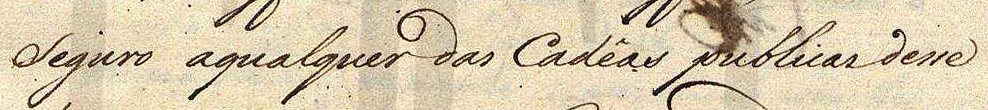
seguro a qualquer das Cadêas publicas desse
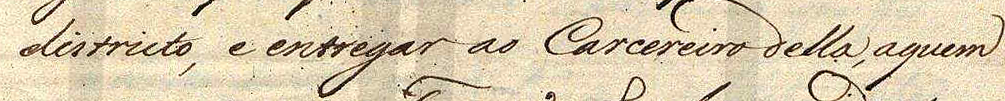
districto, e entregar ao Carcereiro della, a quem
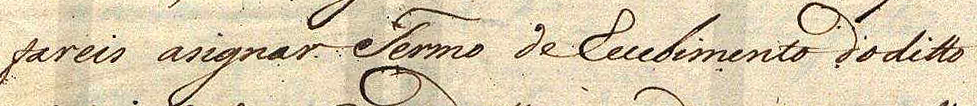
fareis asignar Termo de Recebimento do ditto
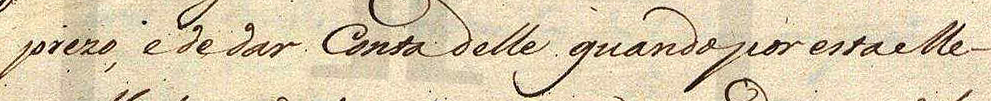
prezo, e de dar conta delle quando por esta Me
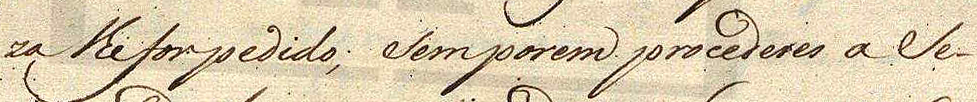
za lhe for pedido; sem porem procederes a Se
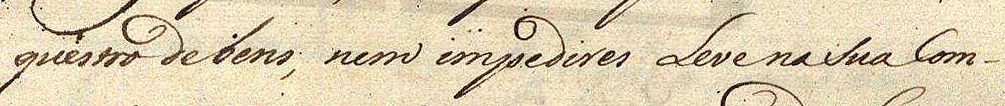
questro de bens, nem impedires Leve na sua Com
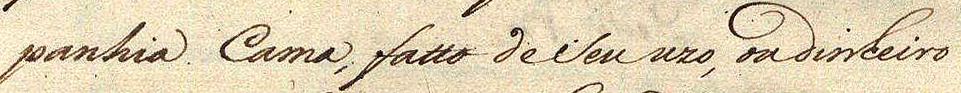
panhia Cama, fatto de seu uzo, ou dinheiro
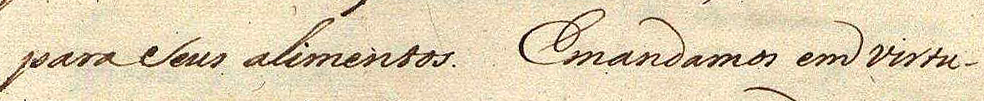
para seus alimentos. E mandamos em virtu
